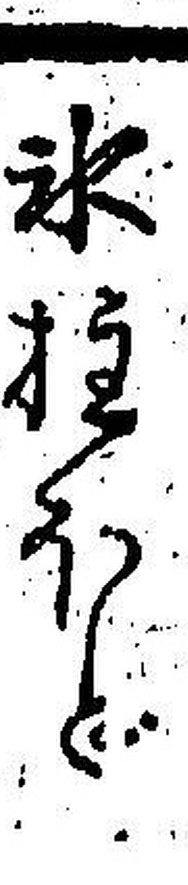氷柱ほど
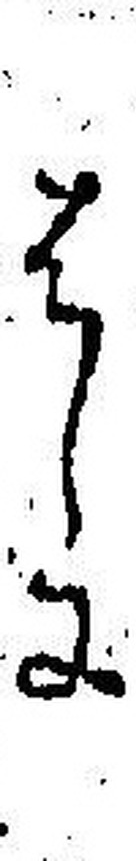はしに
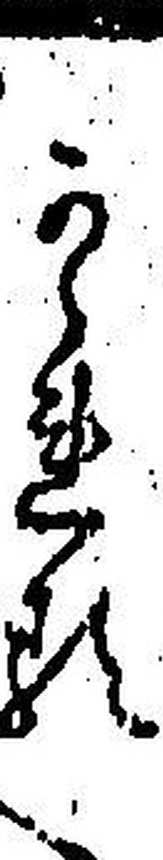かゝれる
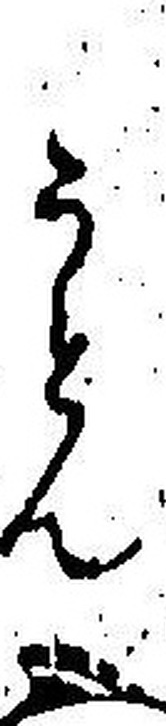うとん
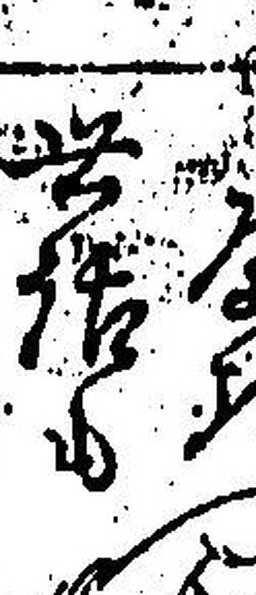世話も
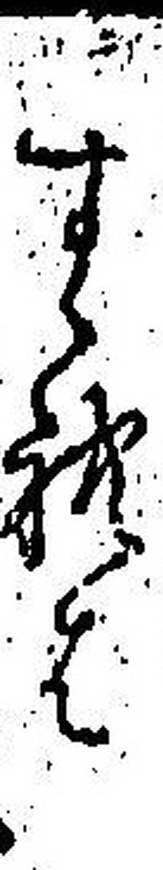すゝれは
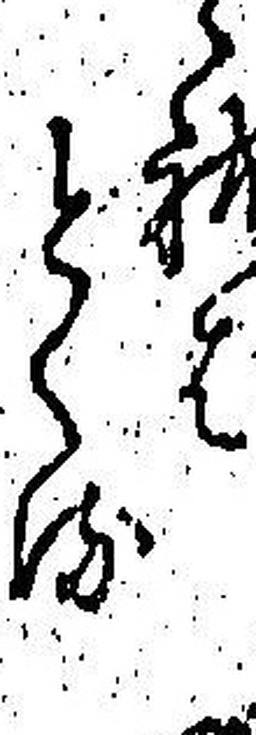とくる
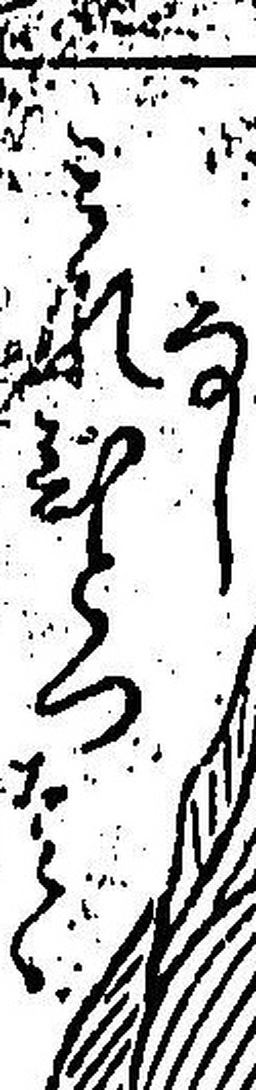みなひとつ
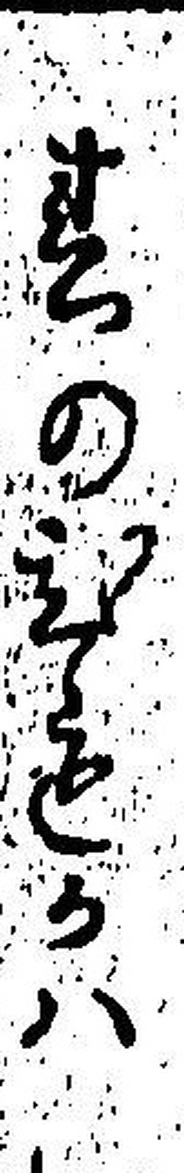春のひもかは
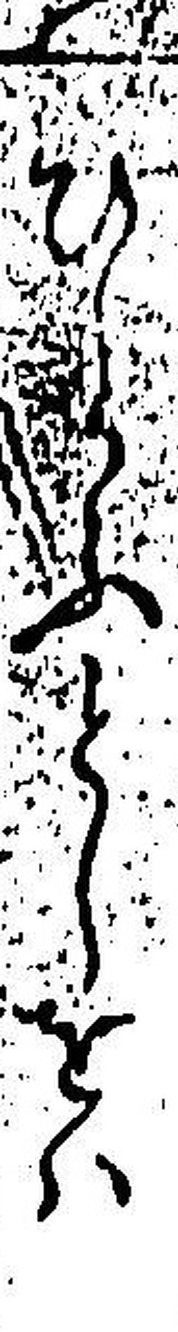ひらふとしをは
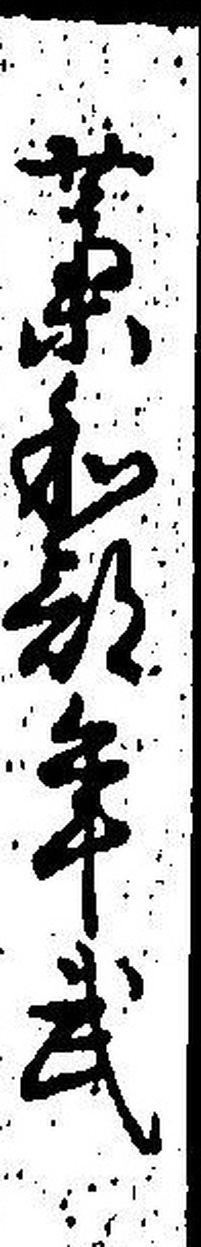藁和部年武
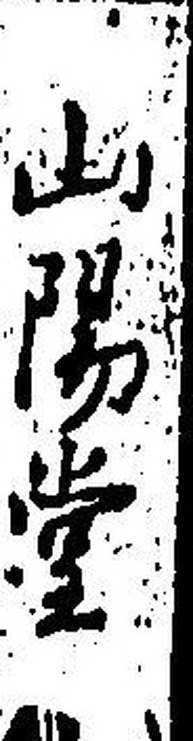山陽堂
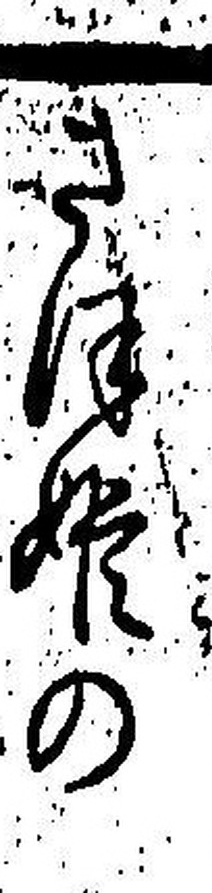さほ姫の
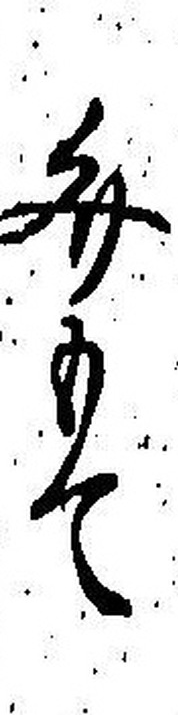文もて
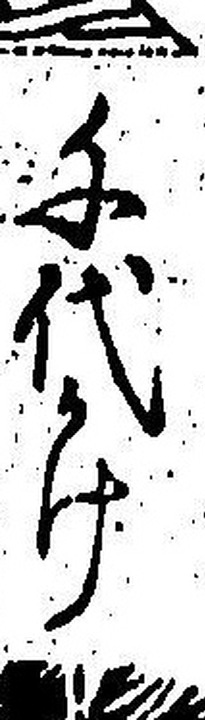千代かけ
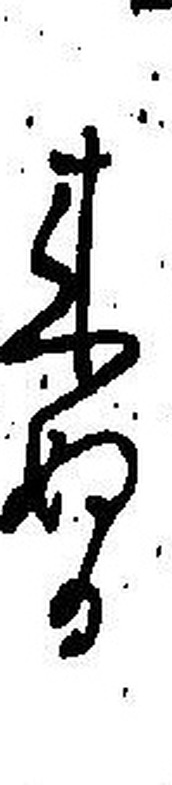来ぬる
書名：どうれ百人一首 / 鹿都部真顔(狂歌堂)編
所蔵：東京大学総合図書館 General Library in the University of Tokyo, JAPAN
